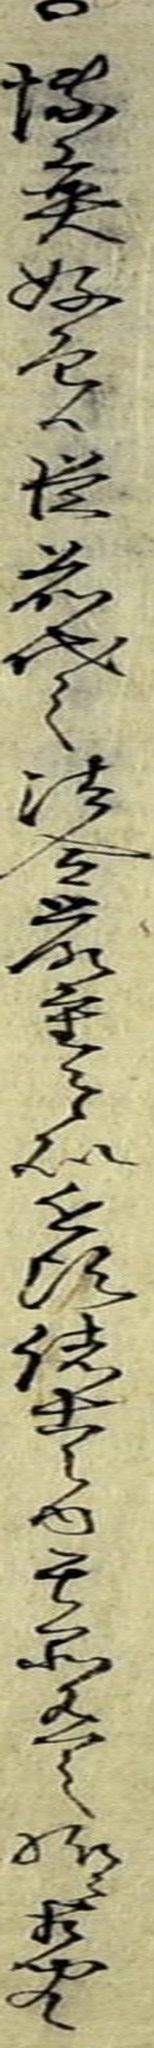〇博奕好色ハ従前代之法令厳重ニ候処近頃諸士之内其品有之様ニ相聞候
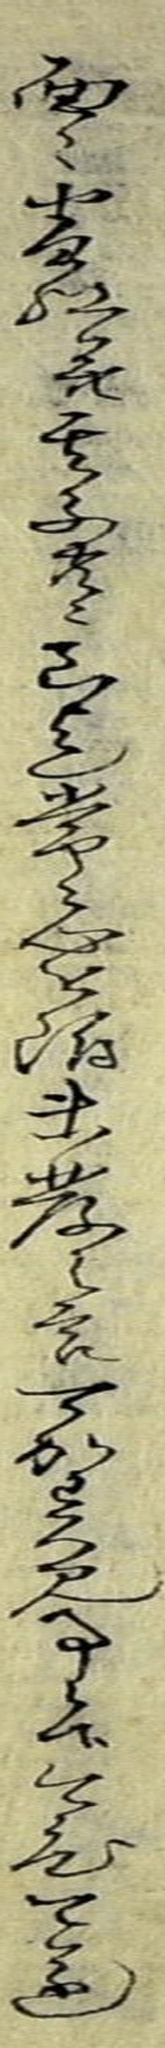面々番組并其子共ニ至迄常々心を附未発之節可加異見事ニ候今度可遂
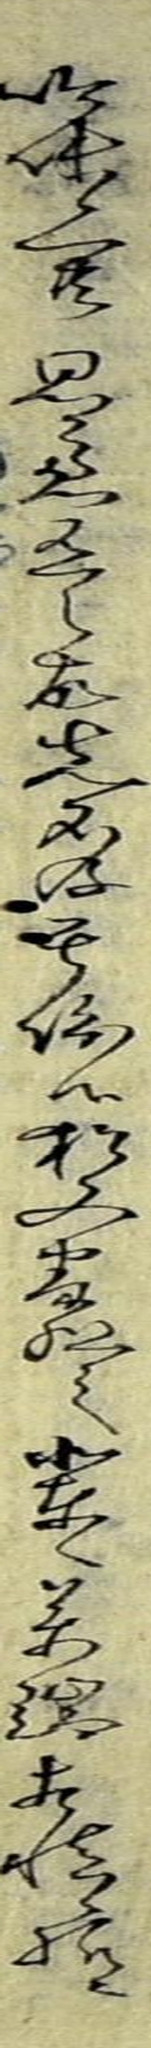吟味候へ共思慮有之故先不及其儀候猶又番組之輩へ万端相慎候様ニ
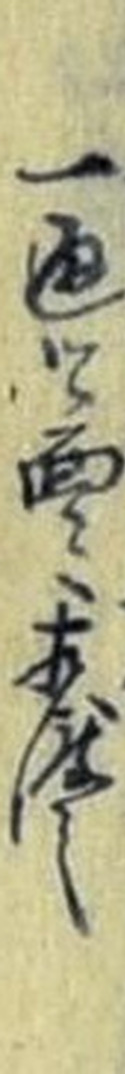一通ツヽ面々へ相渡之

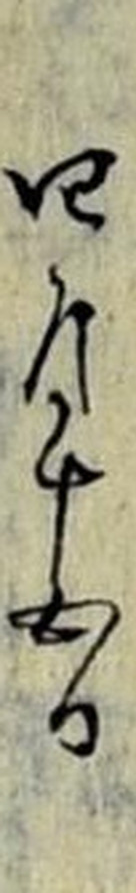四月十五日
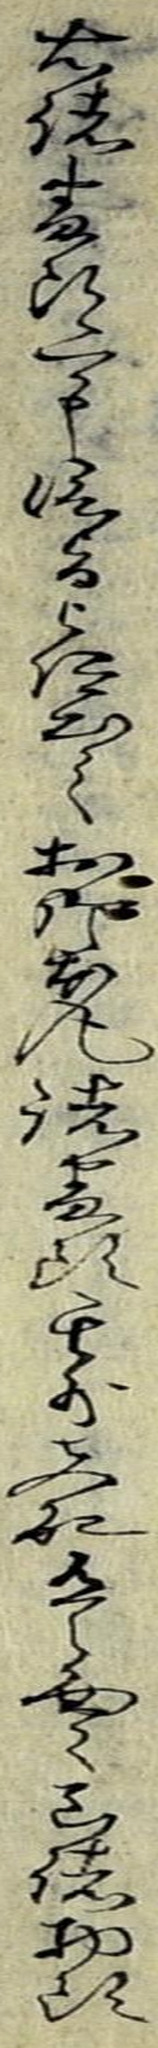右諸番頭へ可申渡旨被仰出之於御本丸諸番頭其外支配有之面々至諸物頭
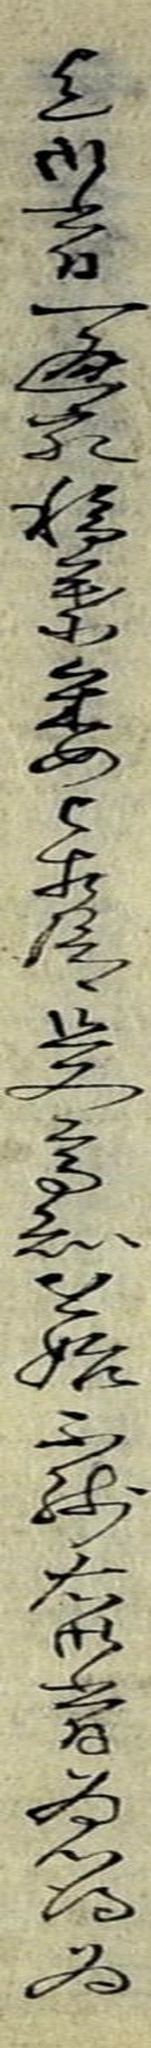迄御書付一通宛稲葉采女被相渡候且又高知を始不残右御書付為心得為
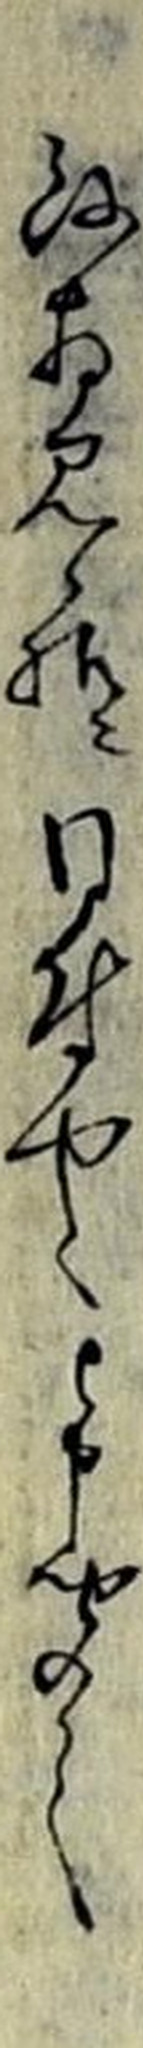致拝見候様ニ目付中へ被申聞之
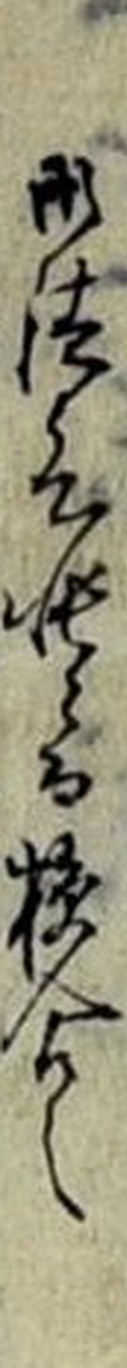御法度帳ニ而校合之
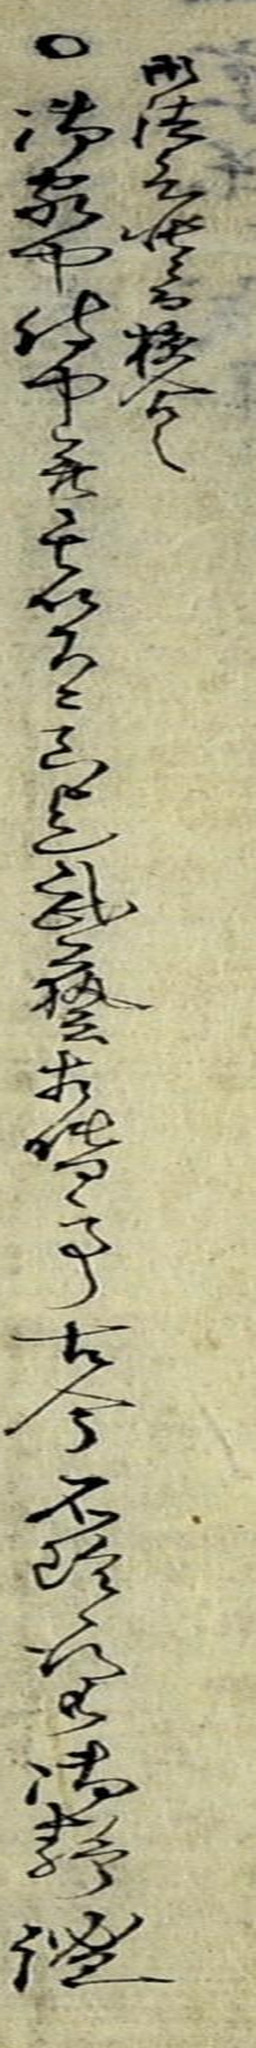〇御家中侍中并其以下ニ至迄武芸相嗜候事古今不珍候得共御静謐
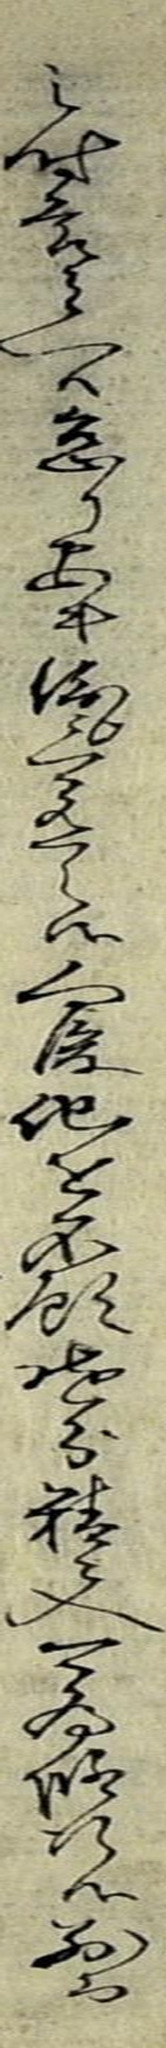之時節ニ候ヘハ怠り安キ儀も可有之候向後他を不顧随分精ニ入可為修行候別而
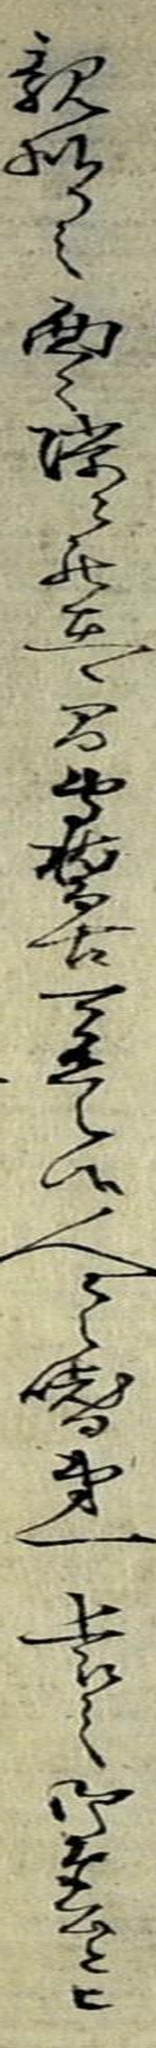親掛り之面々隙ニ罷在候間専稽古可有之候人々之嗜第一上江之御奉公と被
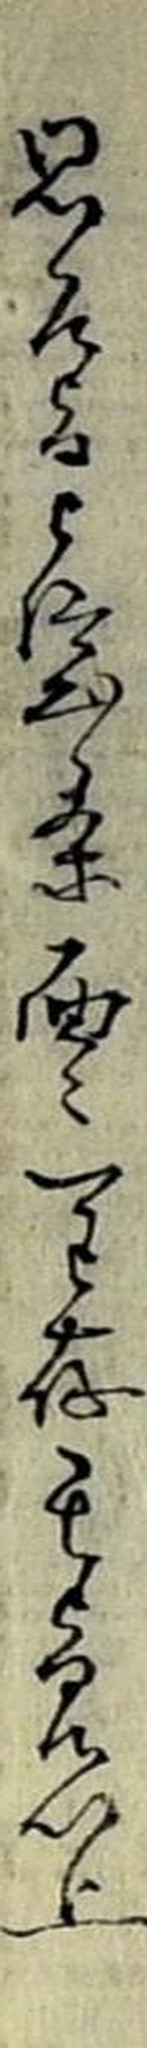思召旨被仰出候条面々可被存其旨候以上
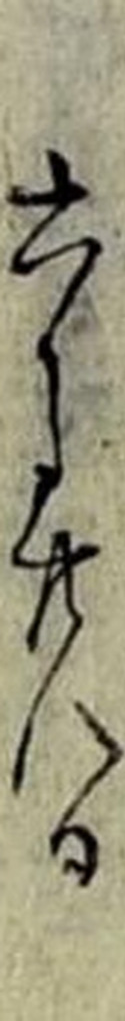六月廿八日
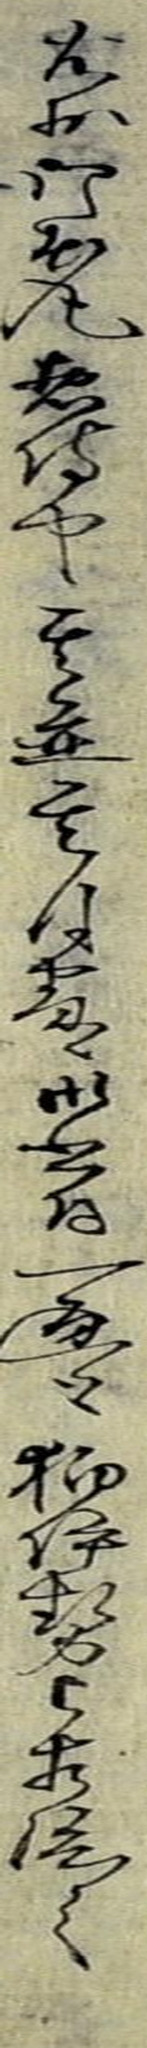右於御本丸惣侍中其並其月番へ御書付一通ツヽ狛伊勢被相渡之
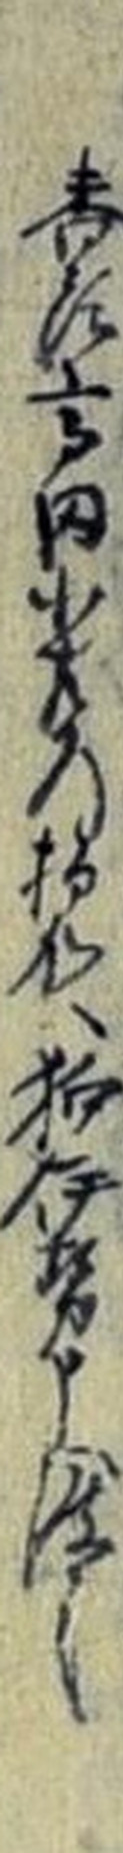番頭高田小左衛門指加へ狛伊勢申渡之
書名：命令之部 一
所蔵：福井県文書館 Fukui Prefectural Archives
